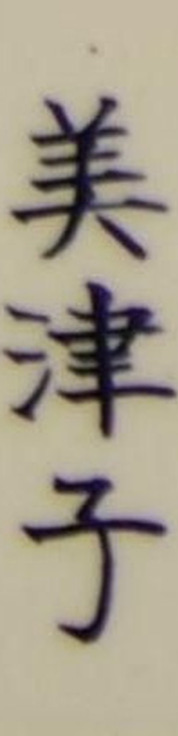美津子

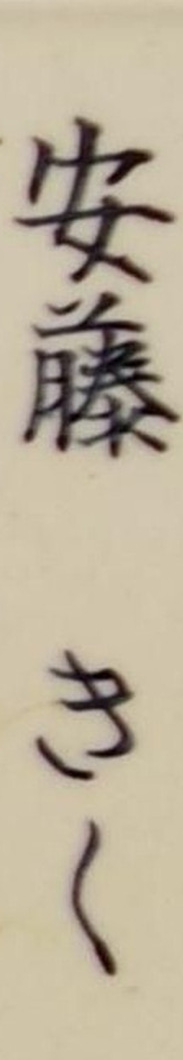安藤きく
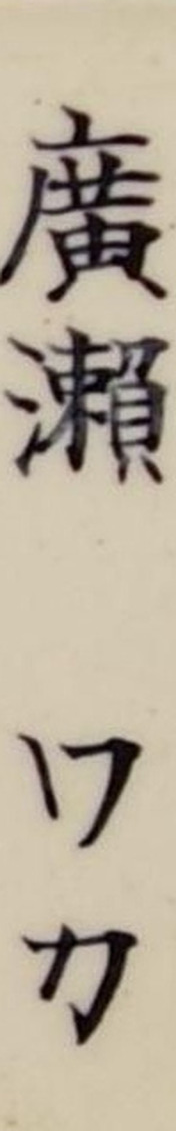広瀬ワカ
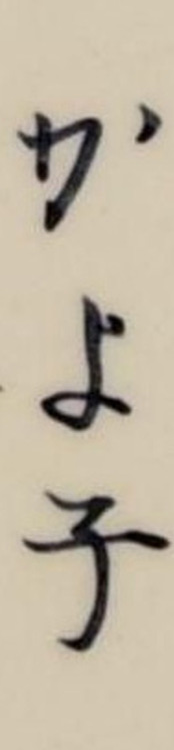かよ子
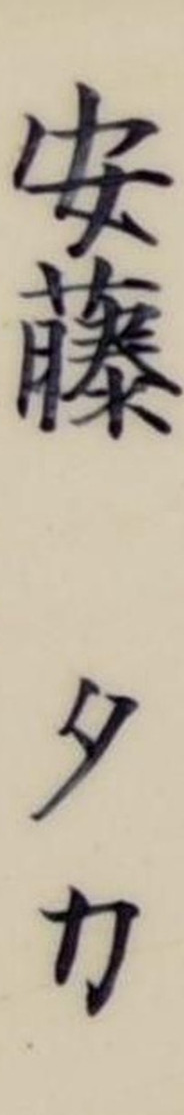安藤夕カ
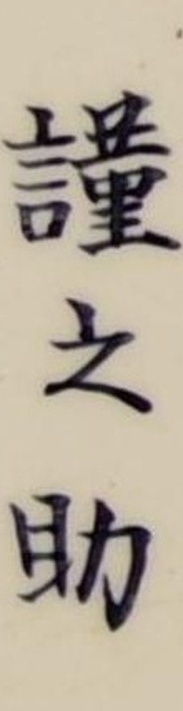謹之助
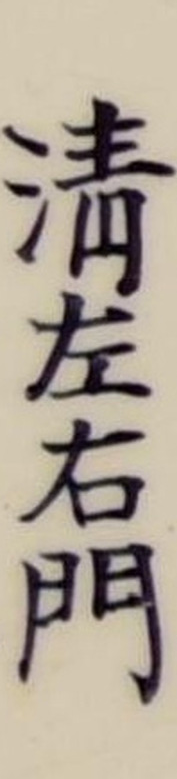清左衛門
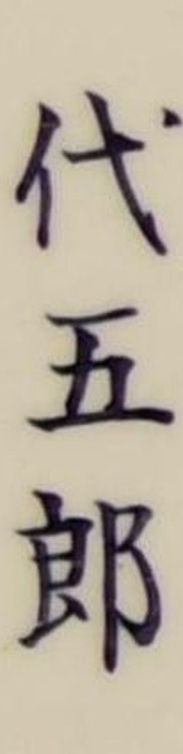代五郎
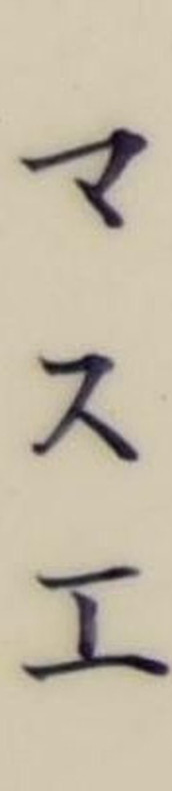マスエ
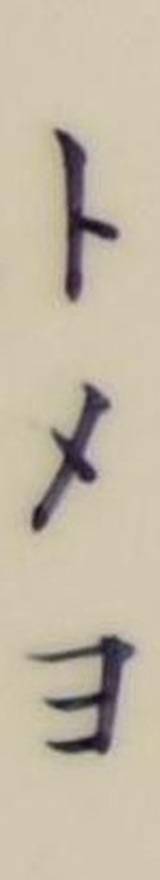トメヨ
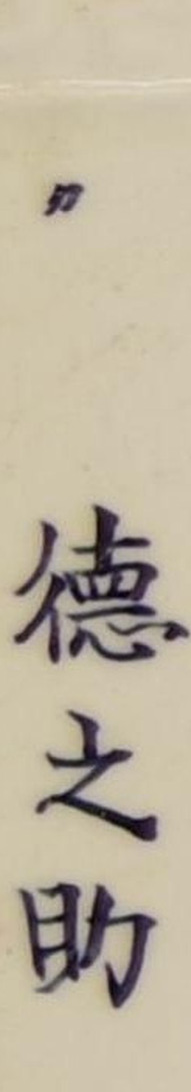徳之助
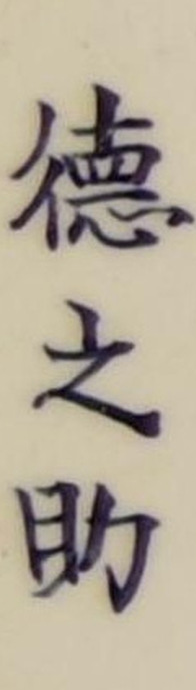徳之助

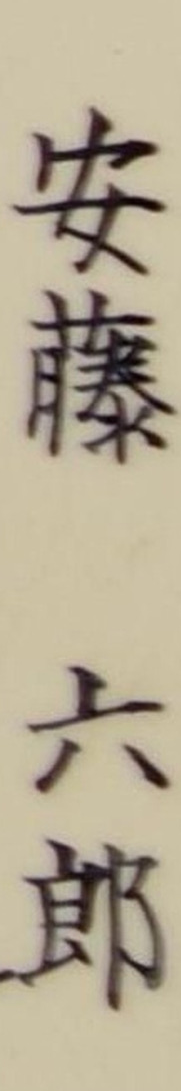安藤六郎
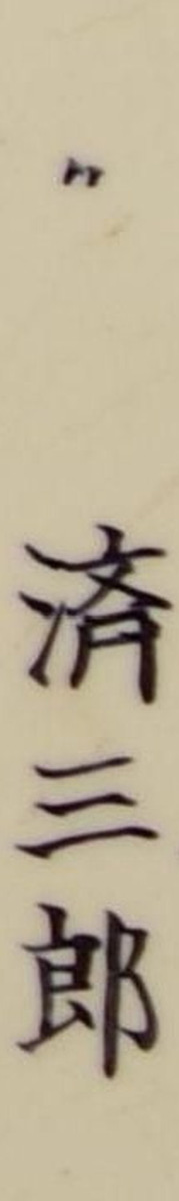済三郎
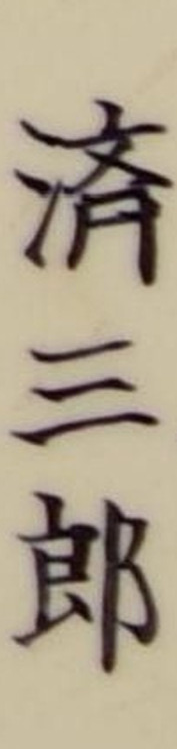済三郎
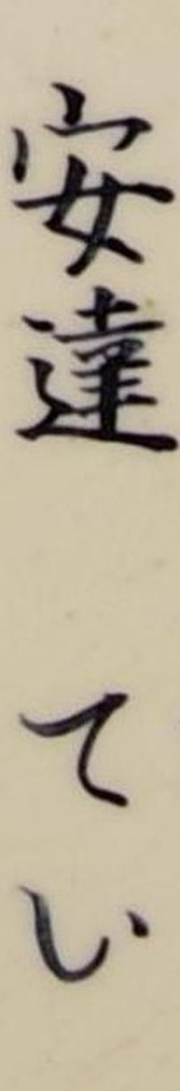安達てい
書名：A~D
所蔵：koyasan kongobuji
